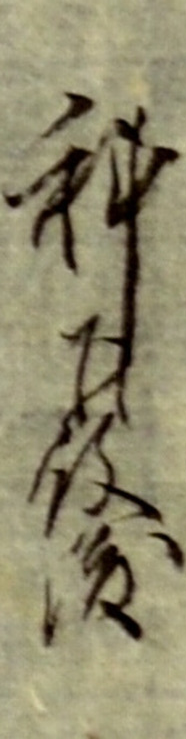料下役渡
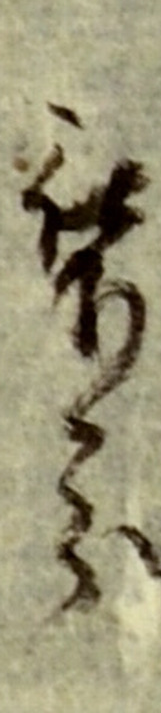被下候分
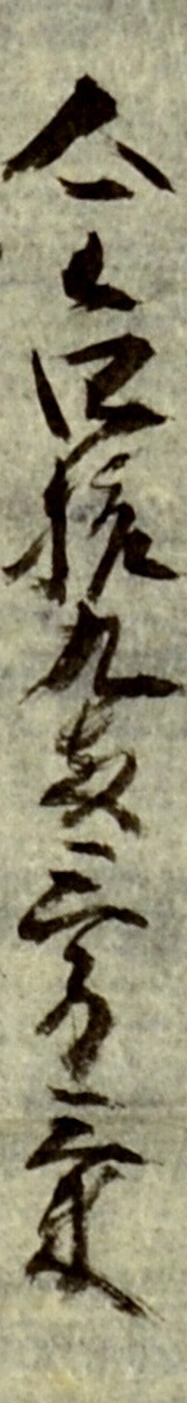金四拾九両三分三朱
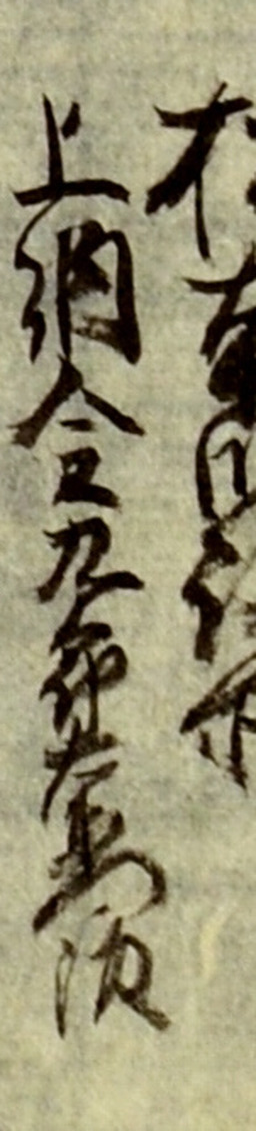上納金九郎右衛門渡
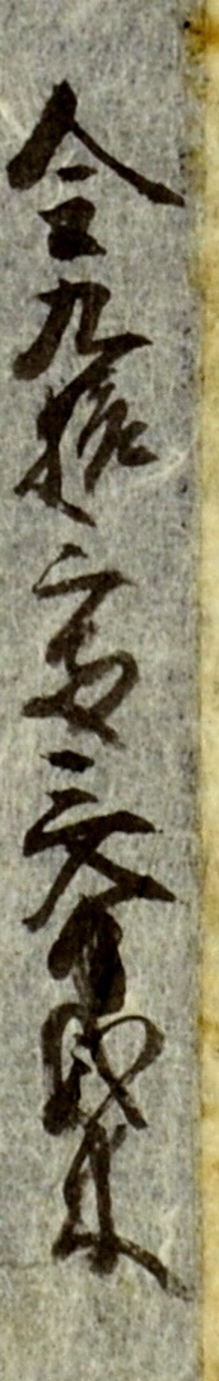金四拾九両三分三朱
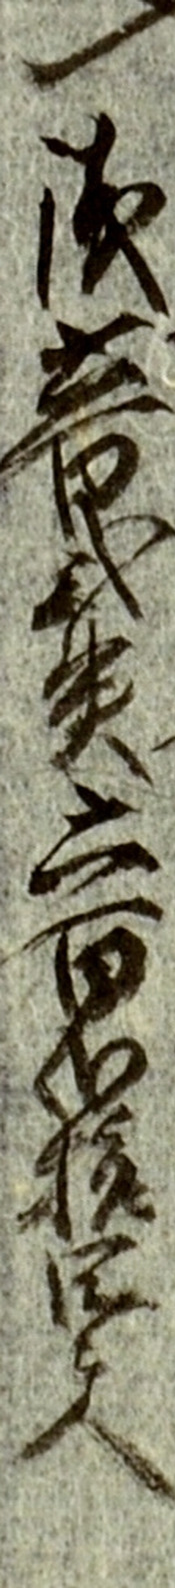〆銭六百弐貫六百弐拾四文
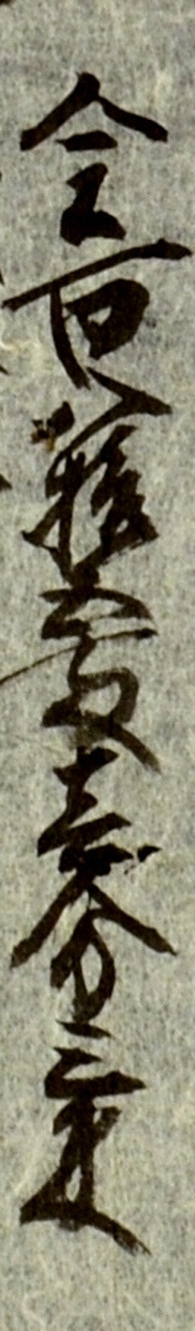金百八拾五両壱分三朱
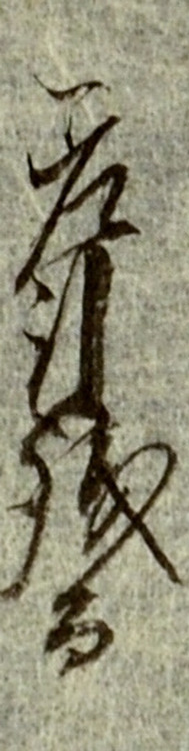差引残而
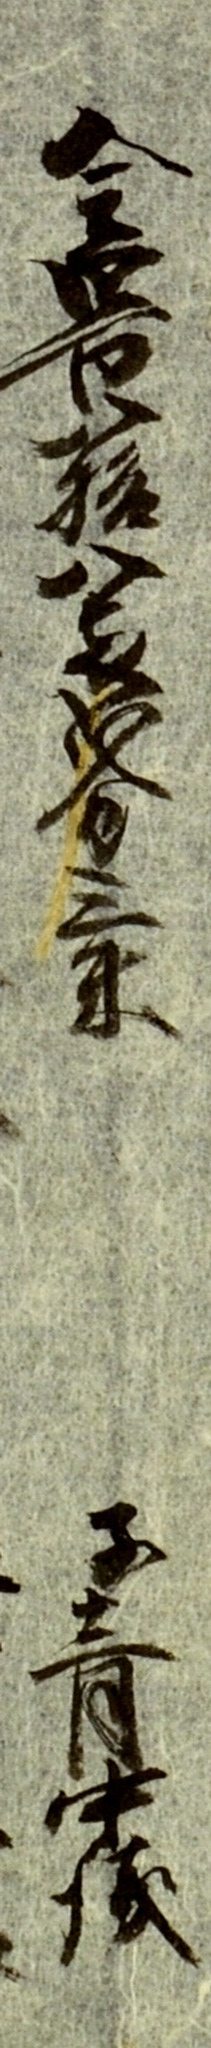金四百八拾八両弐分三朱子十二月中残
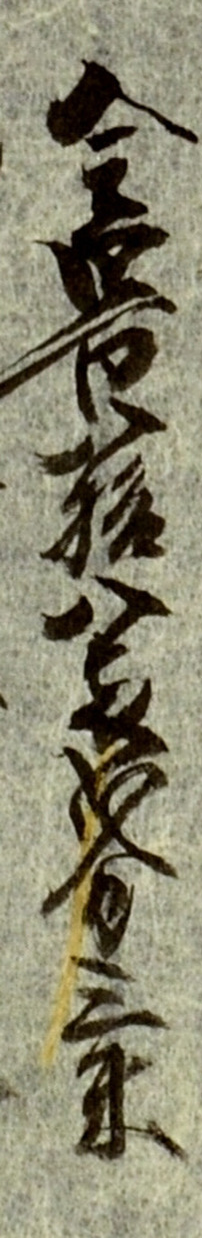金百八拾五両壱分三朱
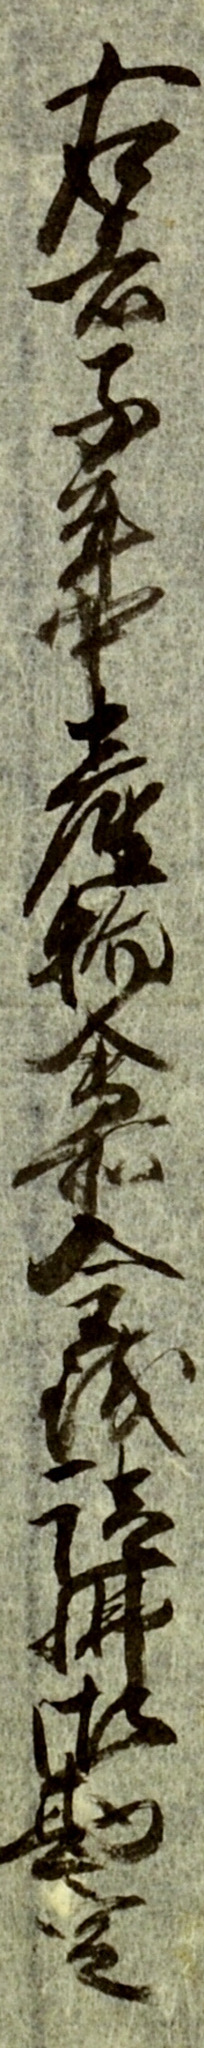右者子年中産物会所金銭請払御勘定
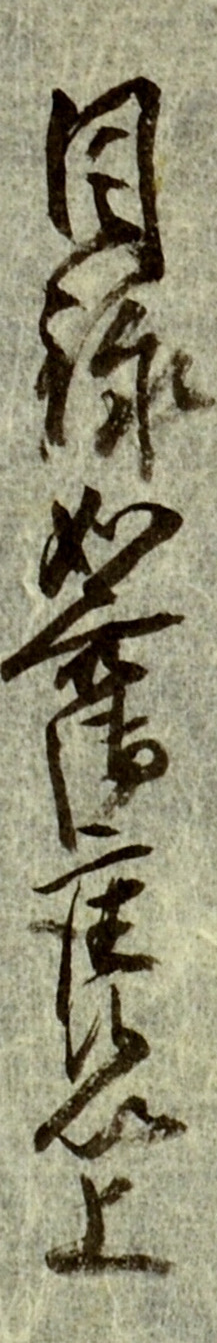目録如此御座候以上
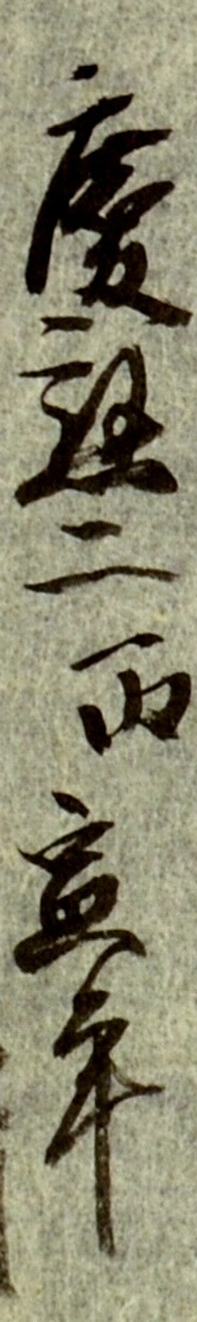慶応二丙寅年
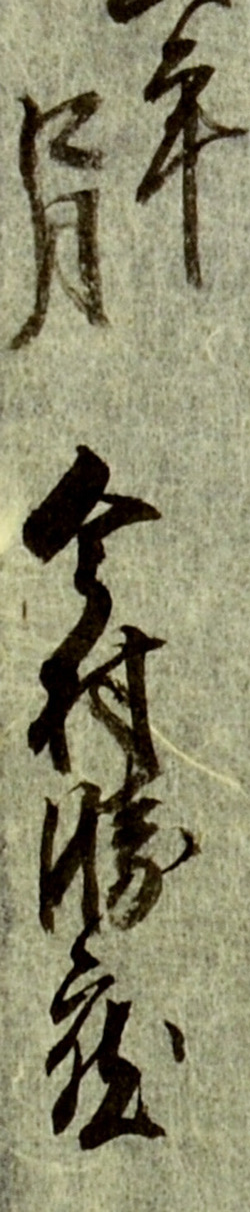四月今村勝蔵
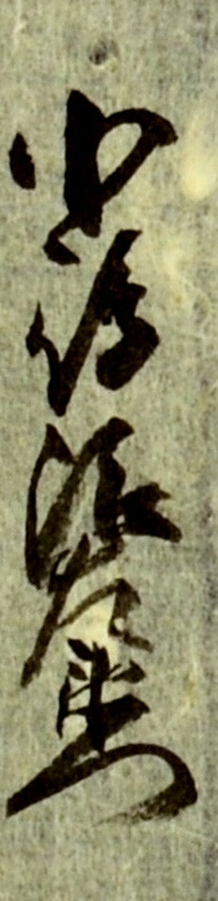北嶋治左衛門
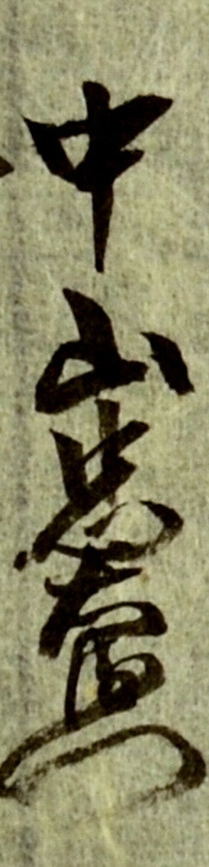中山忠右衛門
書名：産物會所金銭請拂目録控
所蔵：伊那市立高遠町図書館・合同会社AMANE
